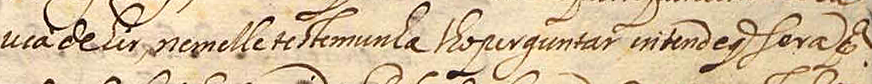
uia de hir, nem elle testemunha lho perguntar intende q̄ sera pa.
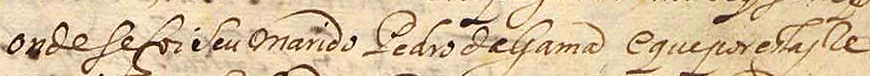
onde se foi seu marido Pedro da Gama, e que por estas Re
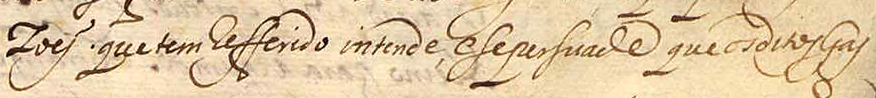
Zoẽs que tem Refferido intende, e se persuade que os ditos Gas
